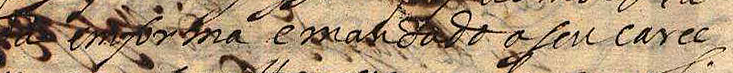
da em forma e mandado a seu carce
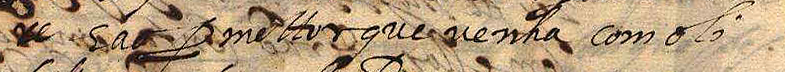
re E ao ꝓmottor que uenha com o li
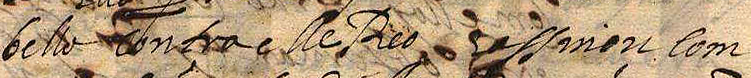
bello contra elle Reo E assinou com
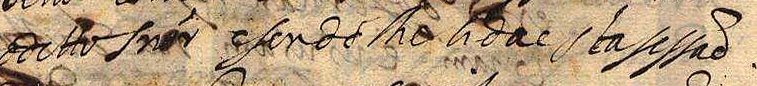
o ditto snor̄ e sendolhe lida esta sessaõ
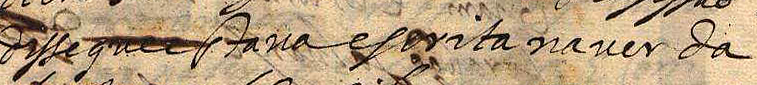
disse que estaua escrita na uerda
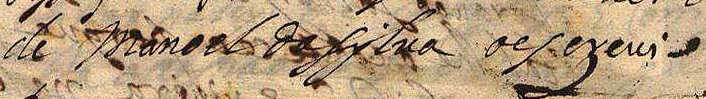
de manoel da sylua o escreui
